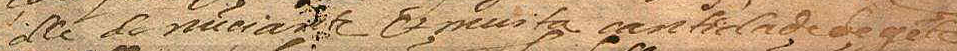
elle denuciante & muita cantidade de gēte
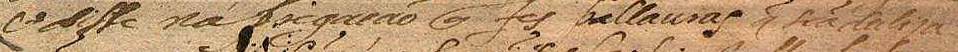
& disse na pregaçaõ q̄ fes pallauras q̄ scādaliza
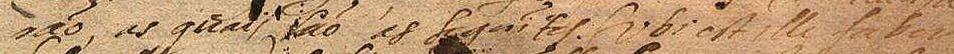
raõ, as quais saõ as seguītes. (vbi est ille faber
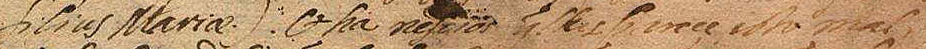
filius Mariæ.). & ha nescios q̄ lhes parece esta mal,
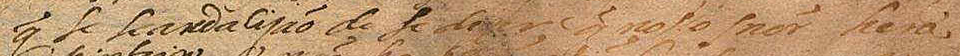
q̄ scandalizaõ de se dizer q̄ noso snor̄ hera
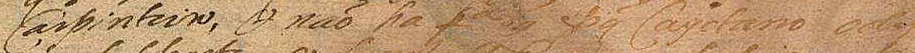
Carpinteiro, & naõ ha ꝑa q̄ ꝓq̄ Cayetano o dis
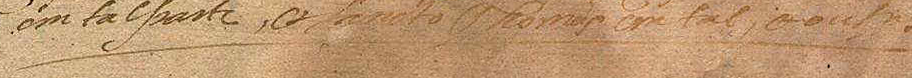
em tal parte, & Sancto Thomas em tal, & outros
